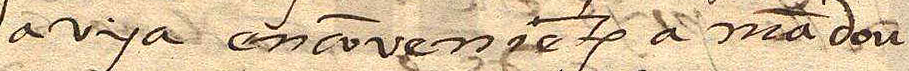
avya encōveniētꝭ a mādou
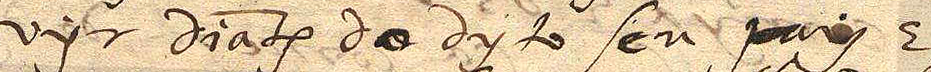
vyr diātꝭ do dyto seu pay E
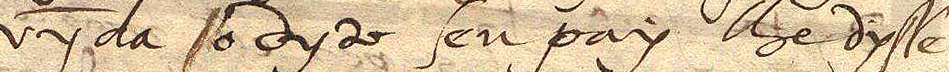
vȳda o dyto seu pay lhe dysse
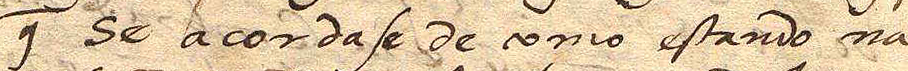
q̄ se acordase de como estando na
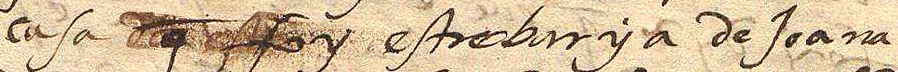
casa q̄ foy estrebarrya de Joana
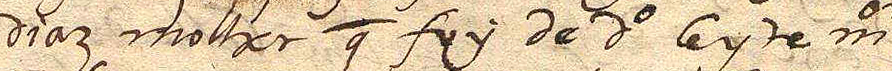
diaz molher q̄ foy de do leyte mor
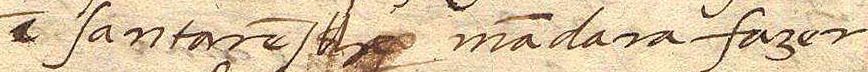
ē santarē / lhe mādara fazer
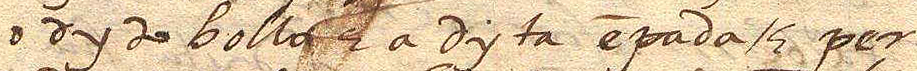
o dyto bollo E a dyta ēpada / E per
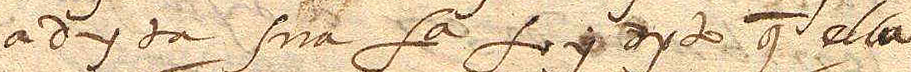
a dyta sua fa foy dyto q̄ ella
